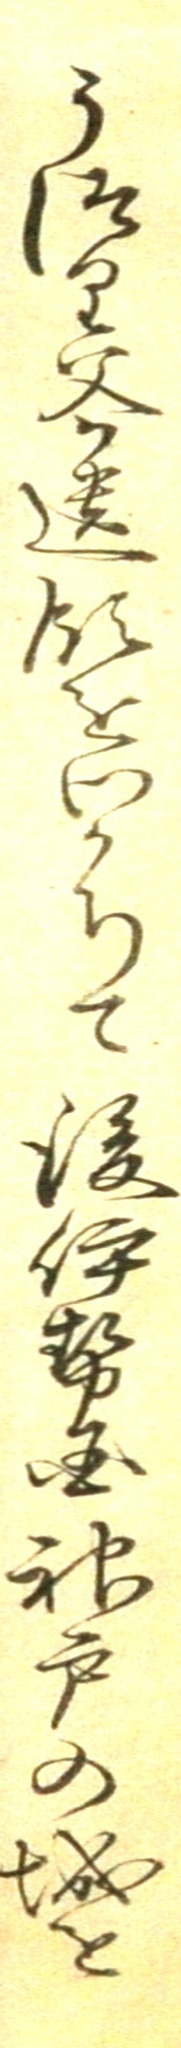うつり父か遺領をわかちて後伊勢国神戸の城を
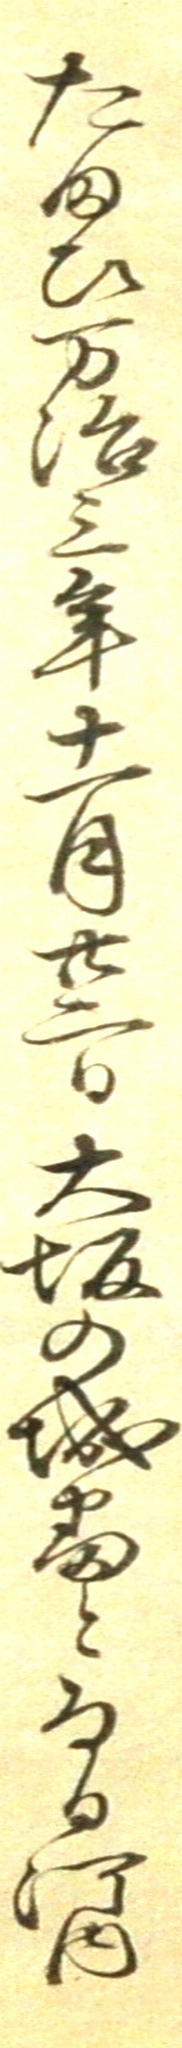たまひ万治三年十一月廿二日大坂の城番となる河内
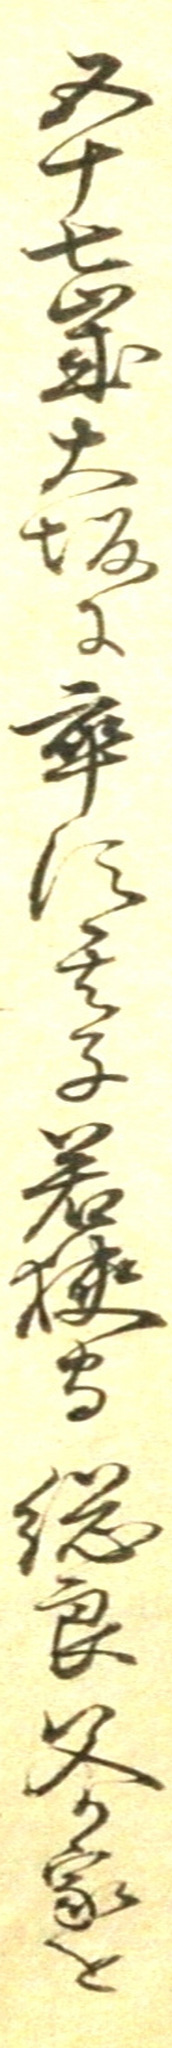五十七歳大坂に卒す其子若狭守総良父か家を
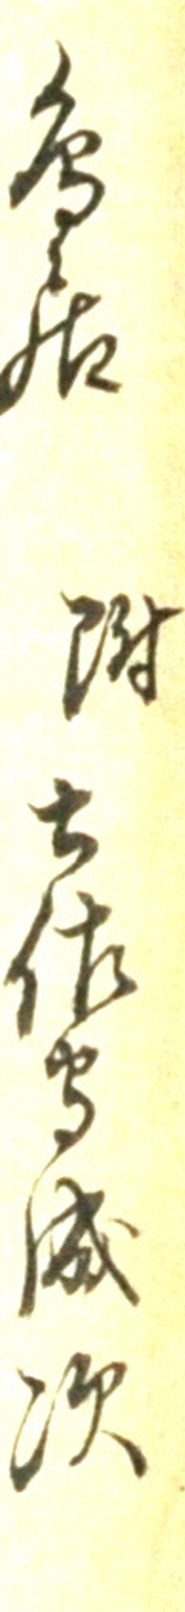鳥居附土佐守成次
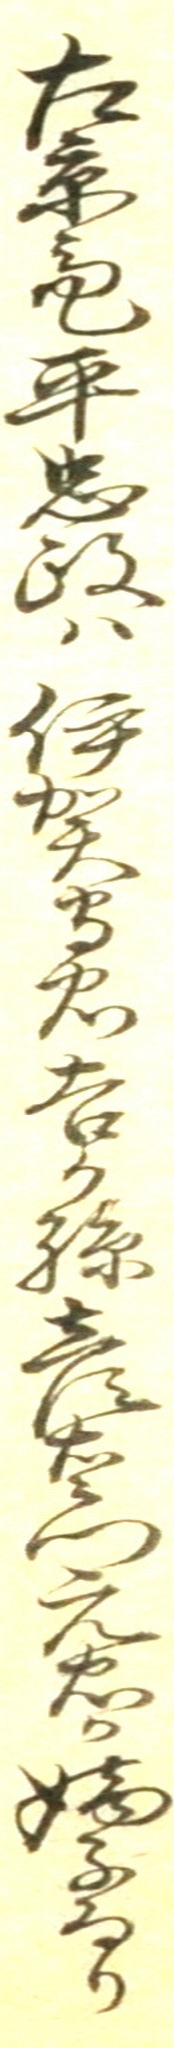左京亮平忠政は伊賀守忠吉か孫彦右衛門元忠か嫡子なり
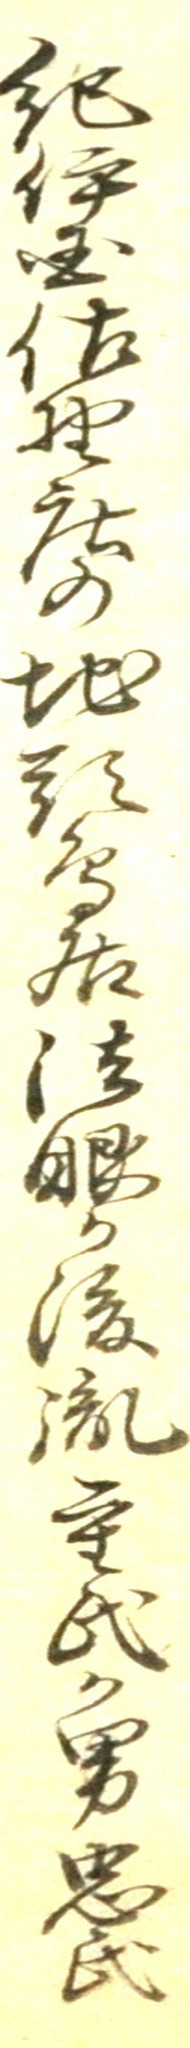紀伊国佐野庄の地頭鳥居法眼か後胤重氏か男忠氏
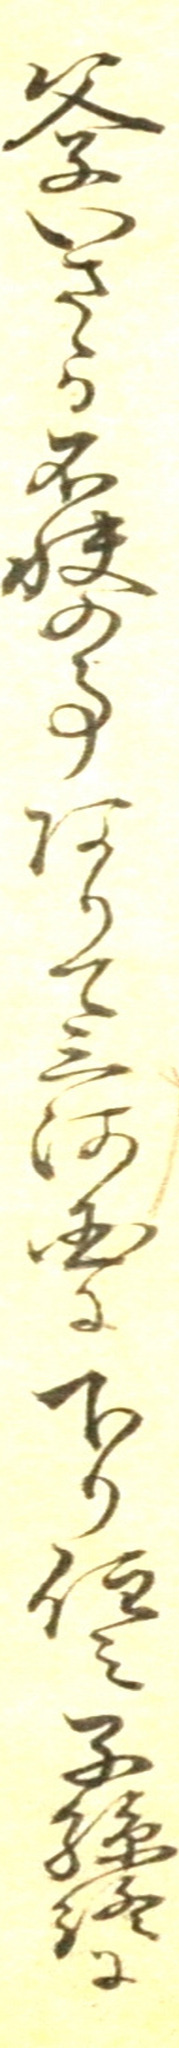父子いさゝか不快の事ありて三河国に下り住み子孫終に
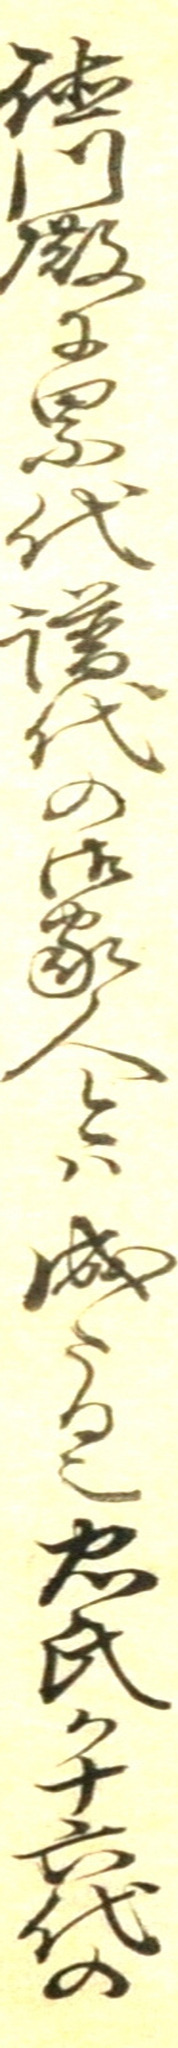徳川殿に累代譜代の御家人とは成たる也忠氏か十六代の
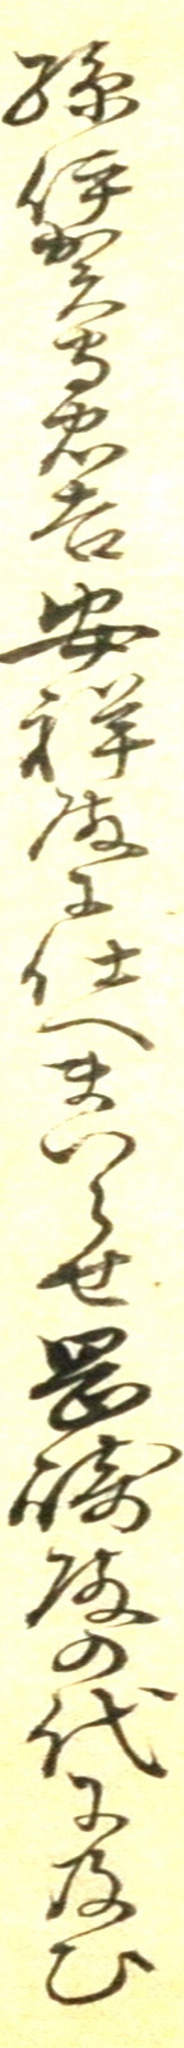孫伊賀守忠吉安祥殿に仕へまいらせ岡崎殿の代に及ひ
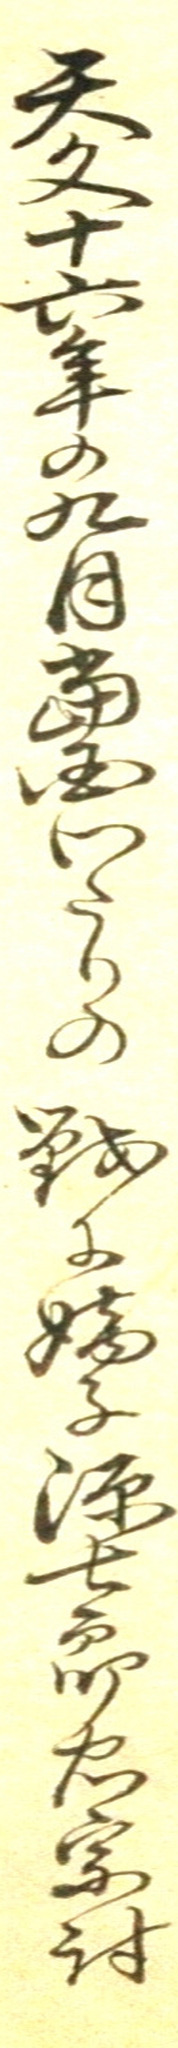天文十六年の九月当国わたりの戦に嫡子源七郎忠宗討
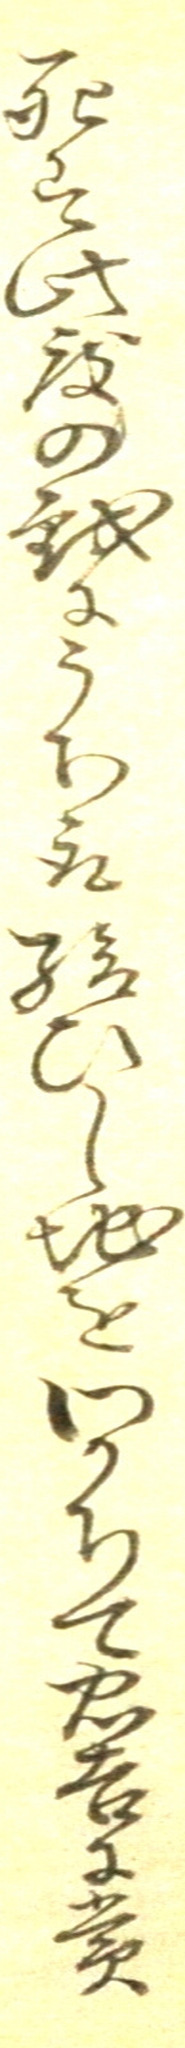死す此度の戦にうち取給ひし地をわかちて忠吉に賞
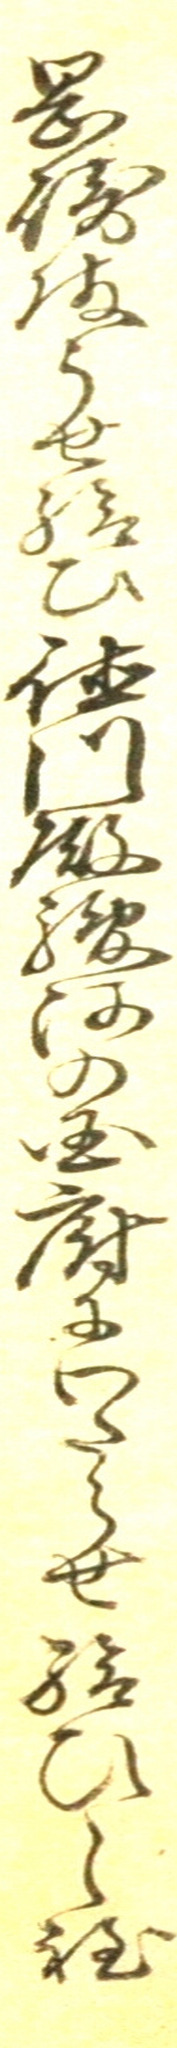岡崎殿うせ給ひ徳川殿駿河の国府にわたらせ給ひし程

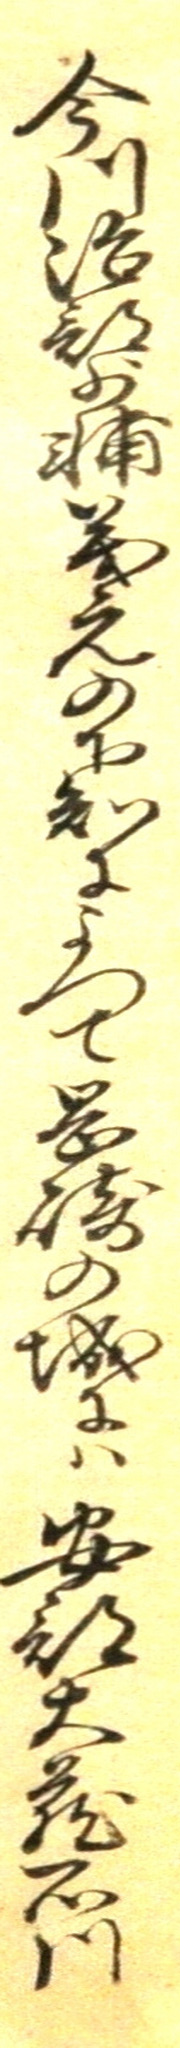今川治部少輔義元の下知によつて岡崎の城には安部大蔵石川
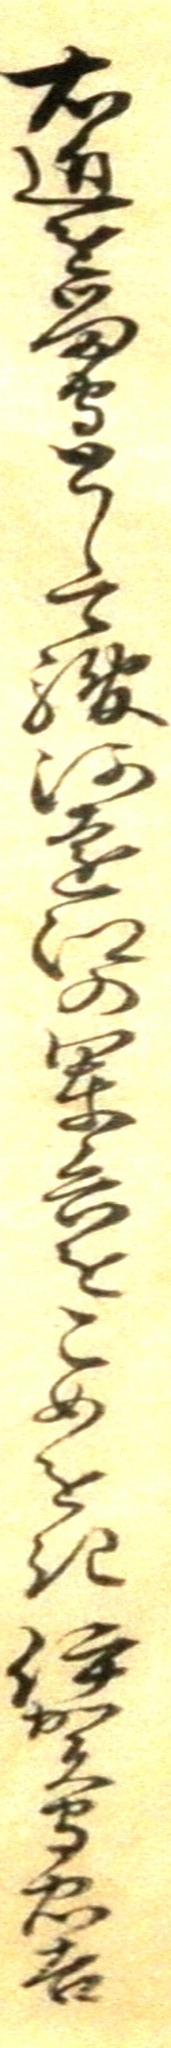右近を留守として駿河遠江の軍兵をこめをき伊賀守忠吉
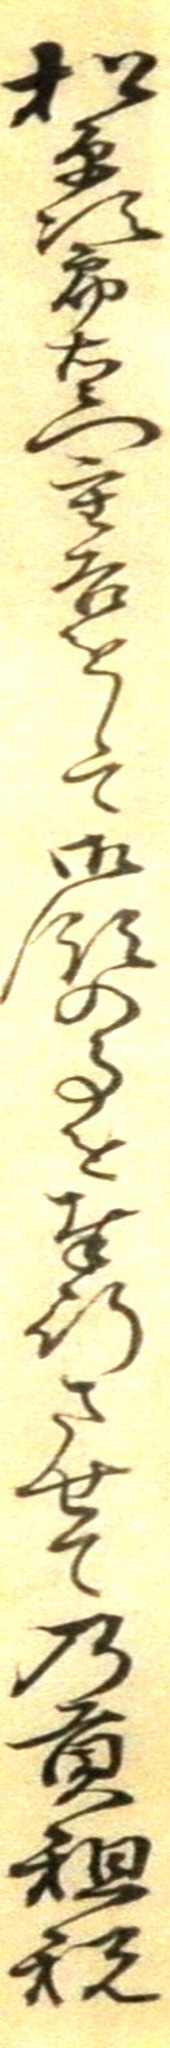松平次郎右衛門重吉をして御領の事を奉行させて乃貢租税
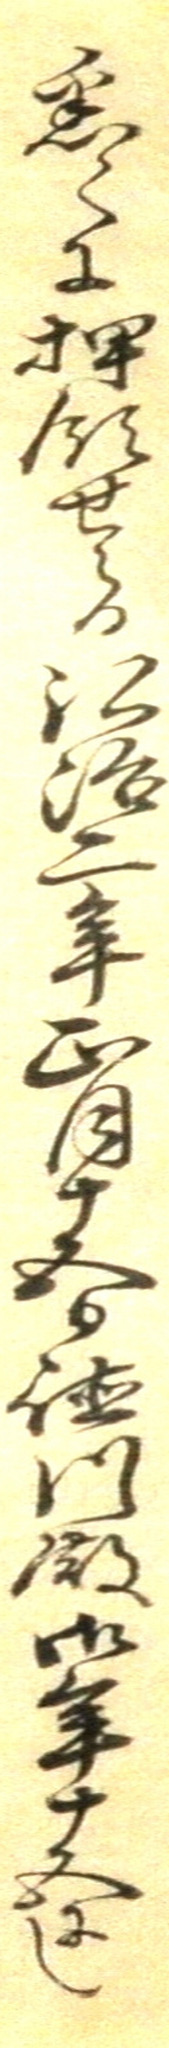悉くに押領せらる弘治二年正月十五日徳川殿御年十五にし
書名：藩翰譜（四・中）
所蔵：伊那市立高遠町図書館・合同会社AMANE
